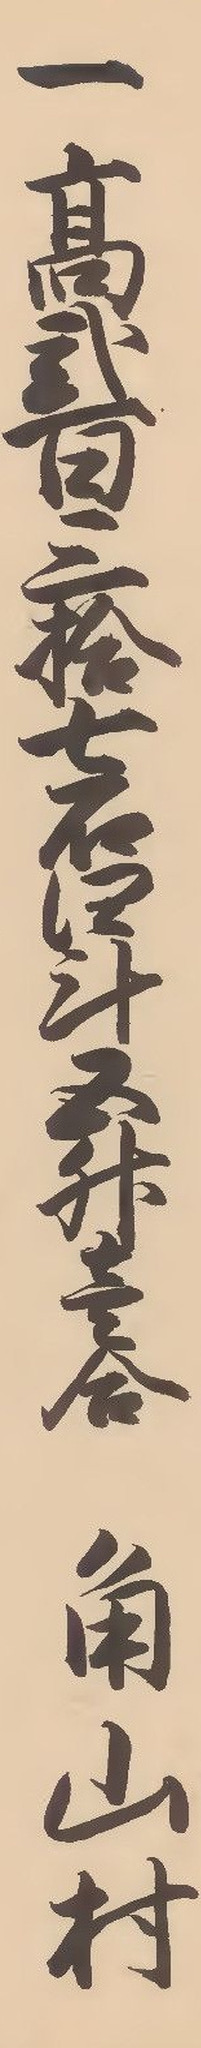一高弐百三拾七石四斗五升壱合角山村
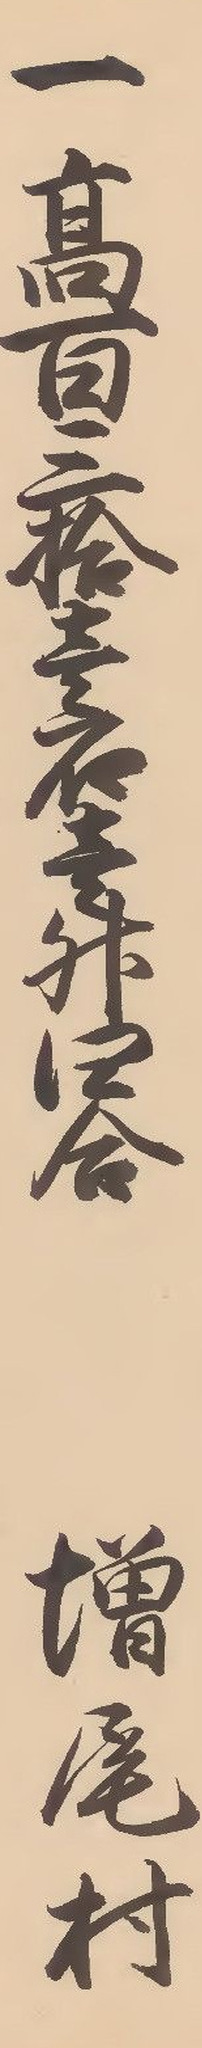一高百三拾壱石壱升四合増尾村
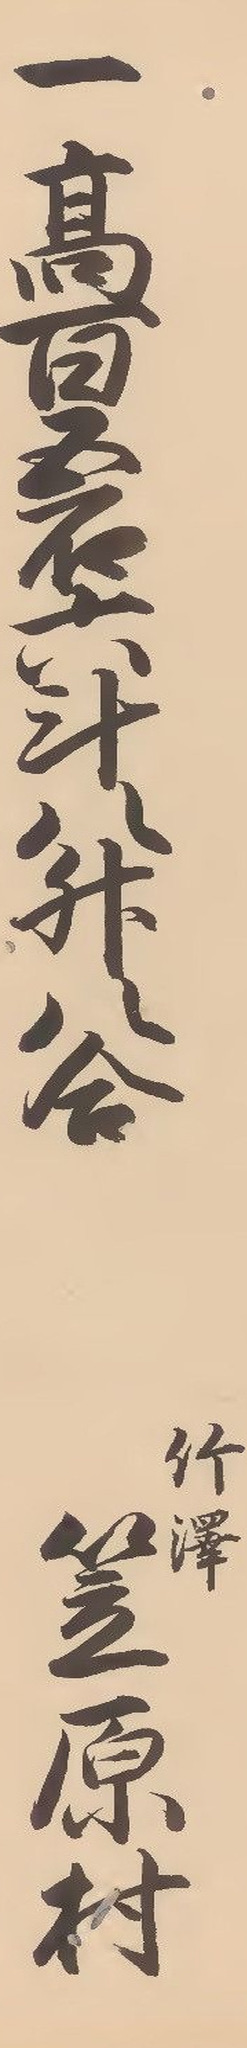一高百五石六斗八升八合笠原村
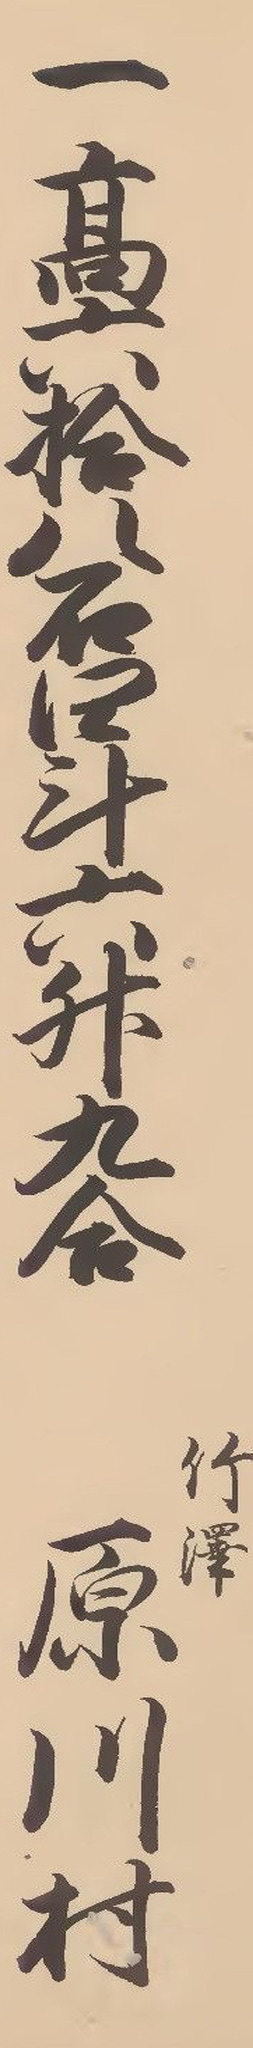一高六拾八石四斗六升九合原川村
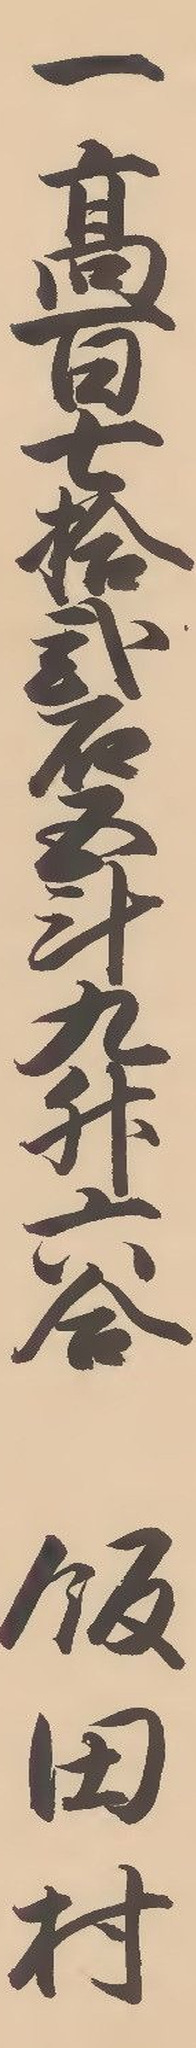一高百七拾弐石五斗九升六合飯田村
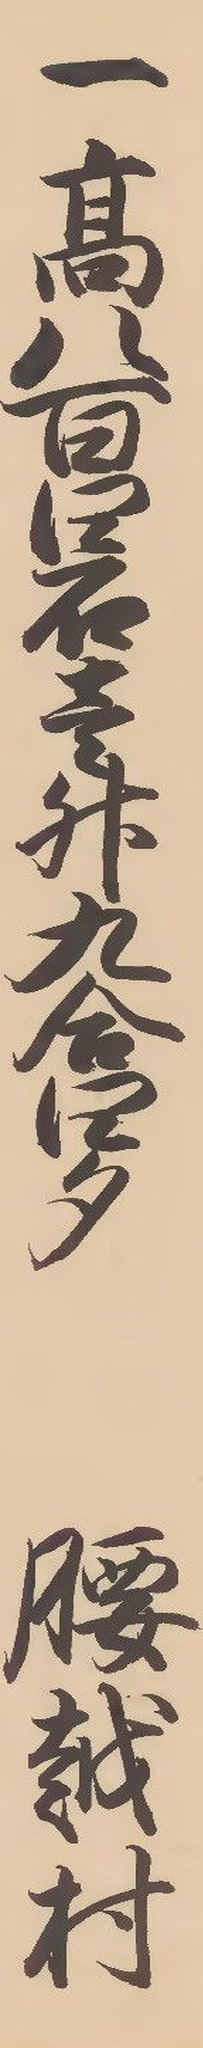一高八百四石壱升九合四勺腰越村
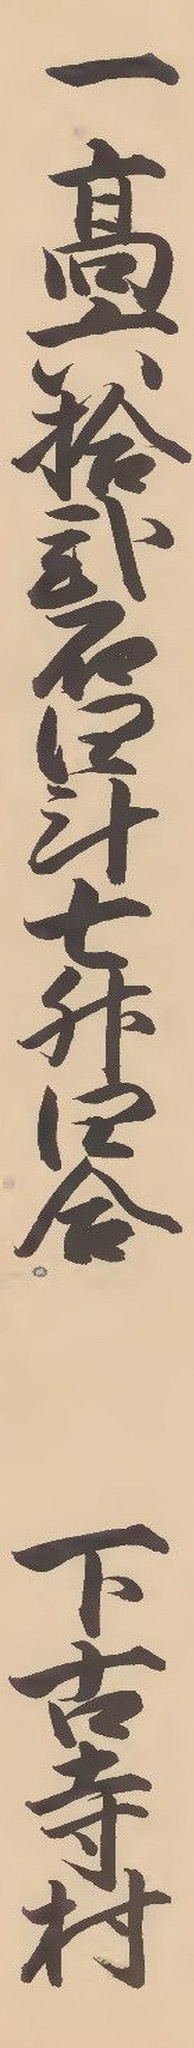一高六拾弐石四斗七升四合下古寺村

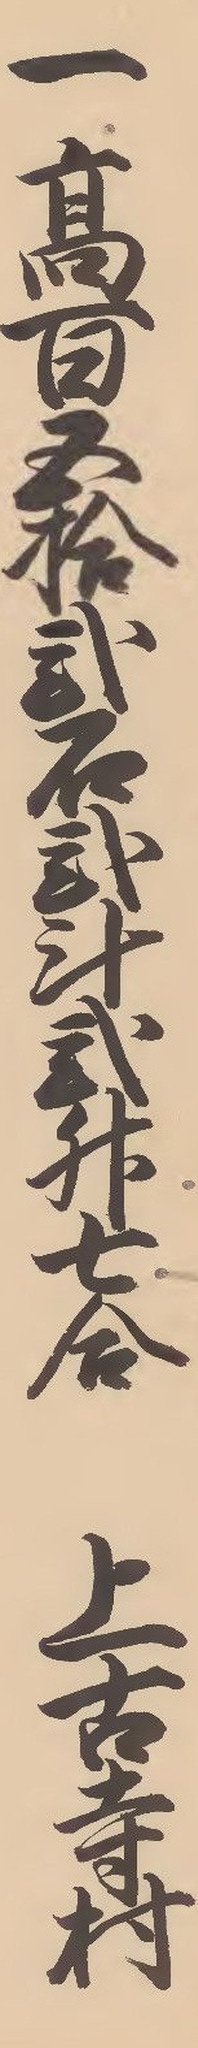一高百五拾弐石弐斗弐升七合上古寺村
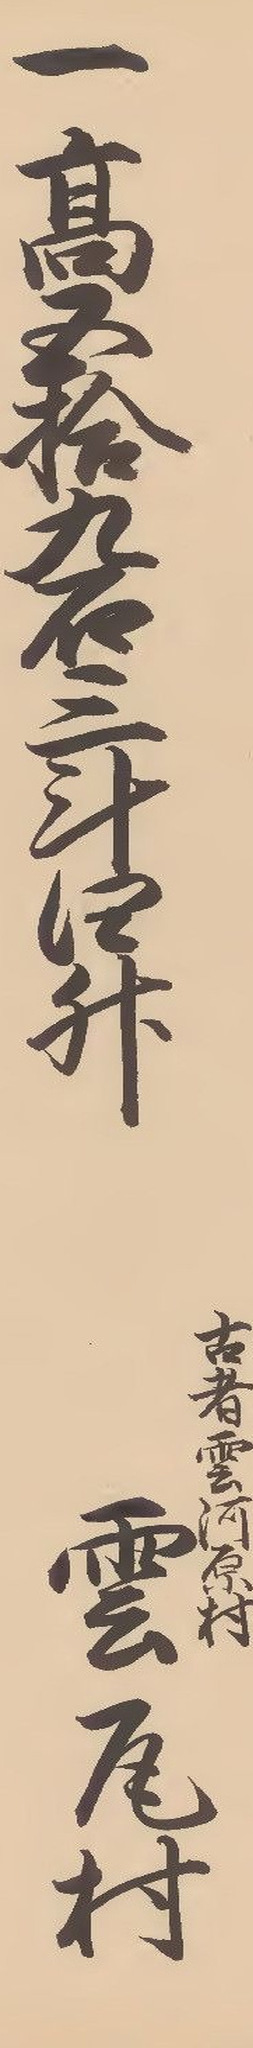一高五拾九石三斗四升雲瓦村
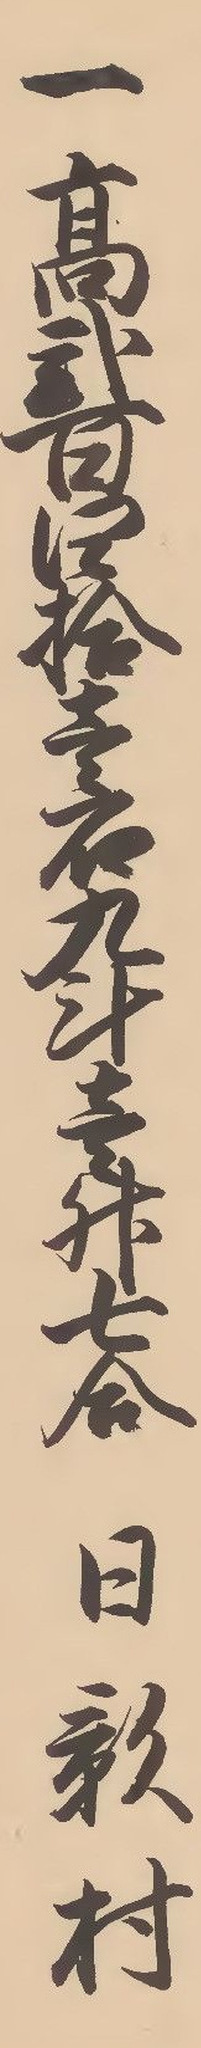一高弐百四拾壱石九斗壱升七合日影村
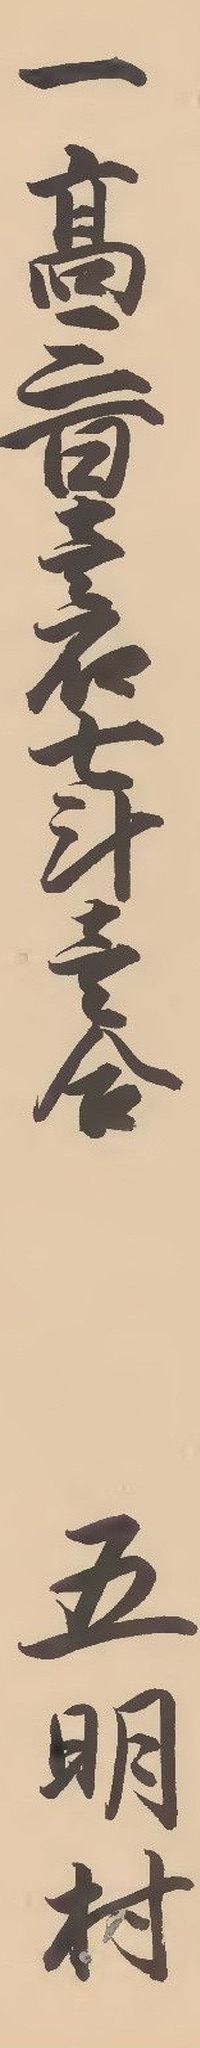一高三百壱石七斗壱合五明村
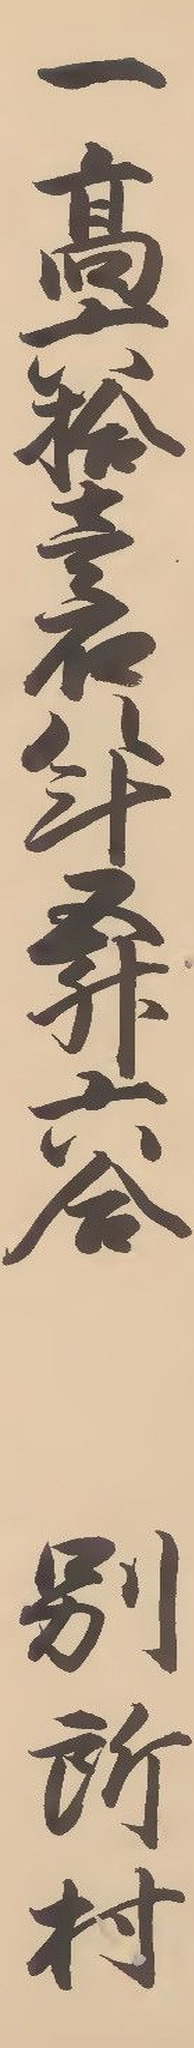一高六拾壱石八斗五升六合別所村
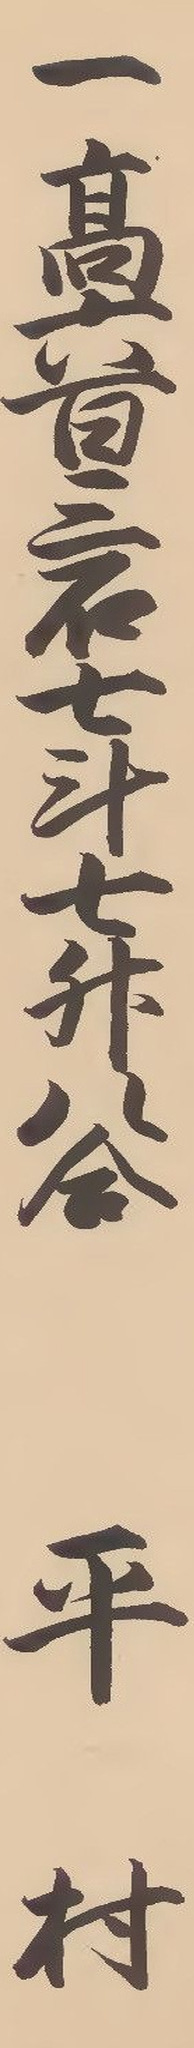一高六百三石七斗七升八合平村
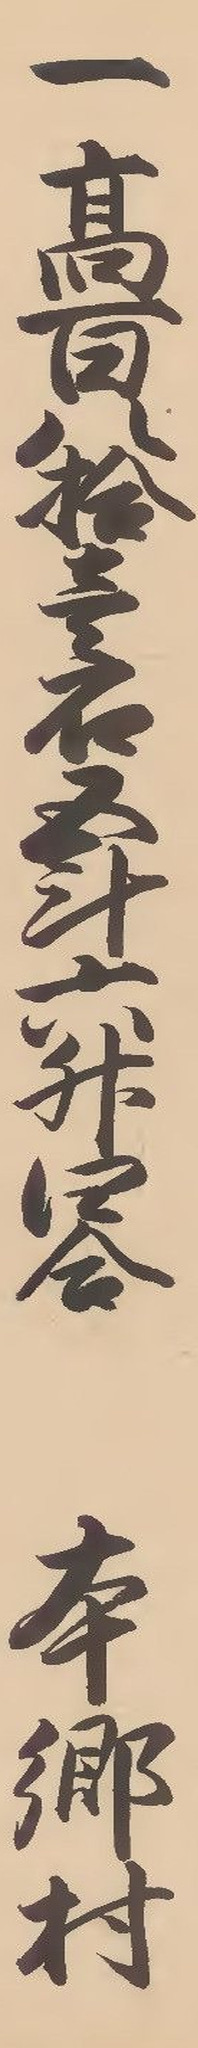一高百八拾壱石五斗六升四合本郷村
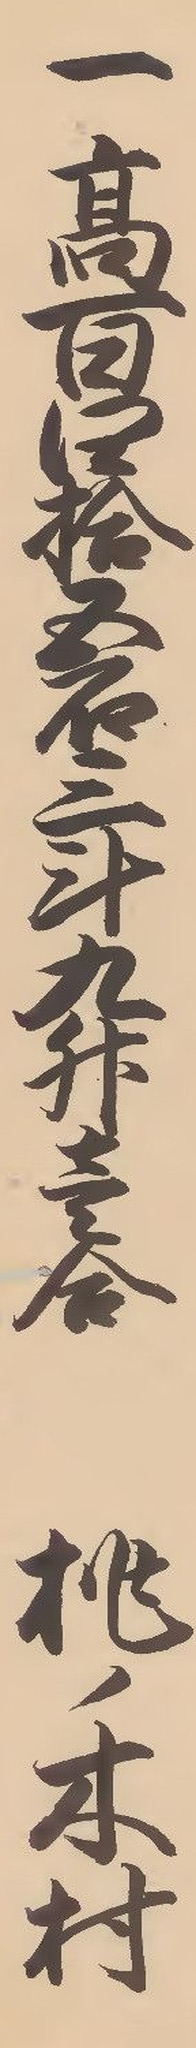一高百四拾五石三斗九升壱合桃ノ木村

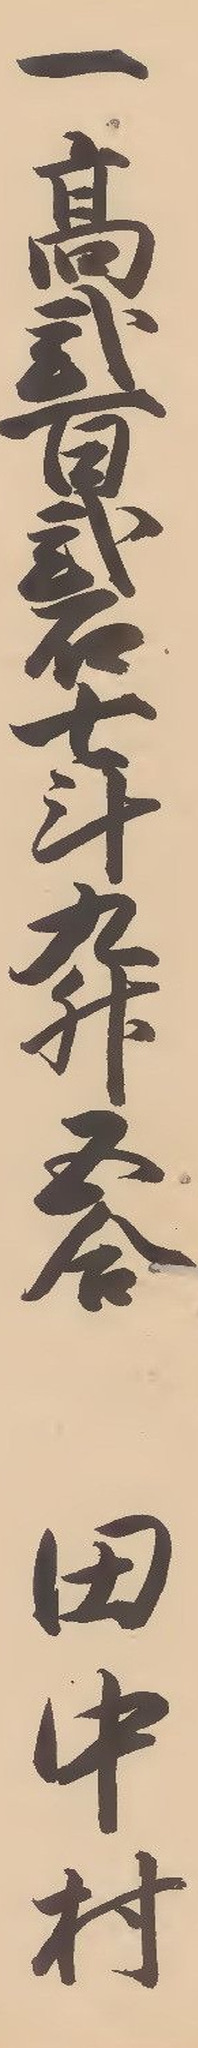一高弐百弐石七斗九升五合田中村
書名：武蔵国郷帳　下
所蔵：国立公文書館 National Archives of Japan
